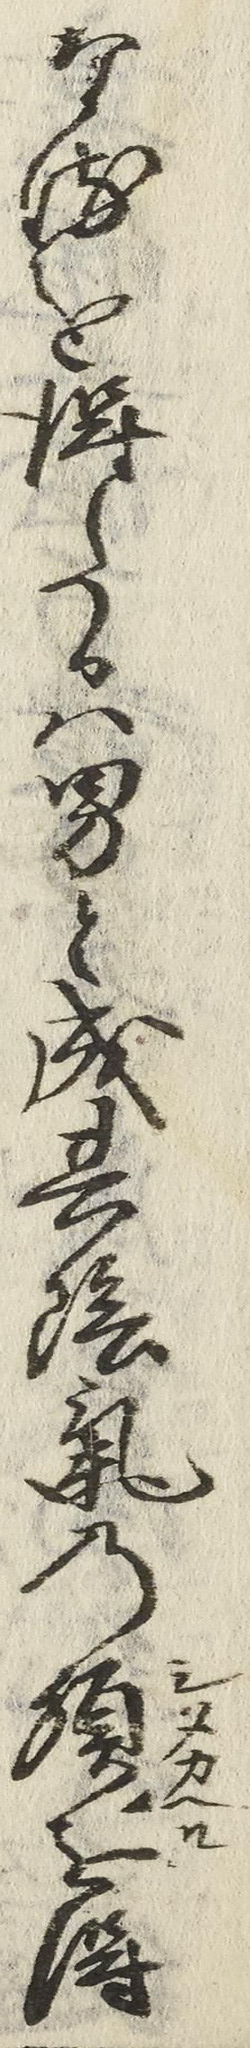なるを得たるは男と成其陰気の順を得
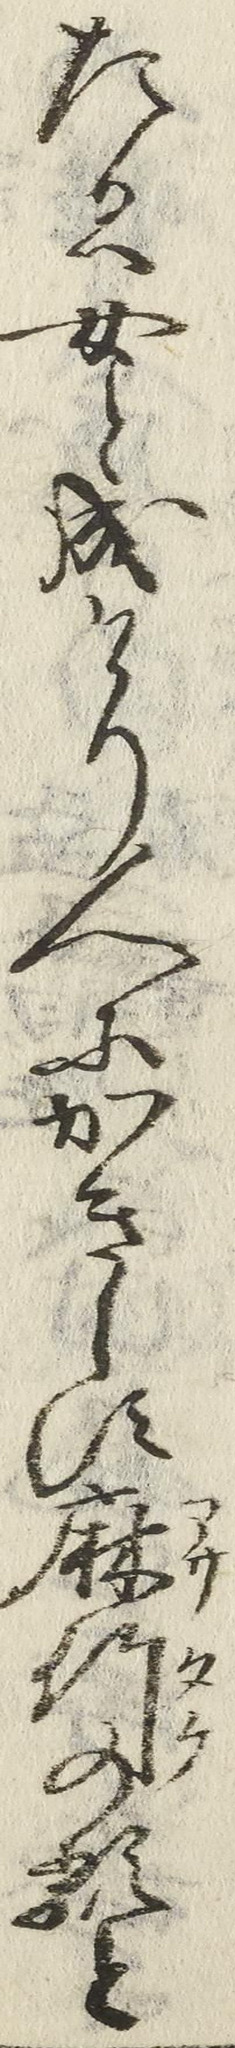たるは女と成けり人にかきらす麻竹の類と
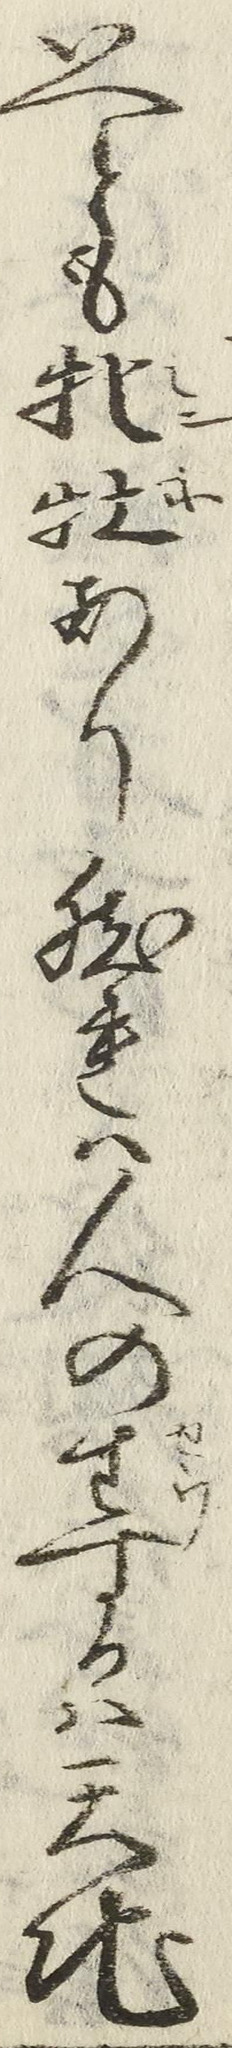いへとも牝牡あり然れは人の生するは天地
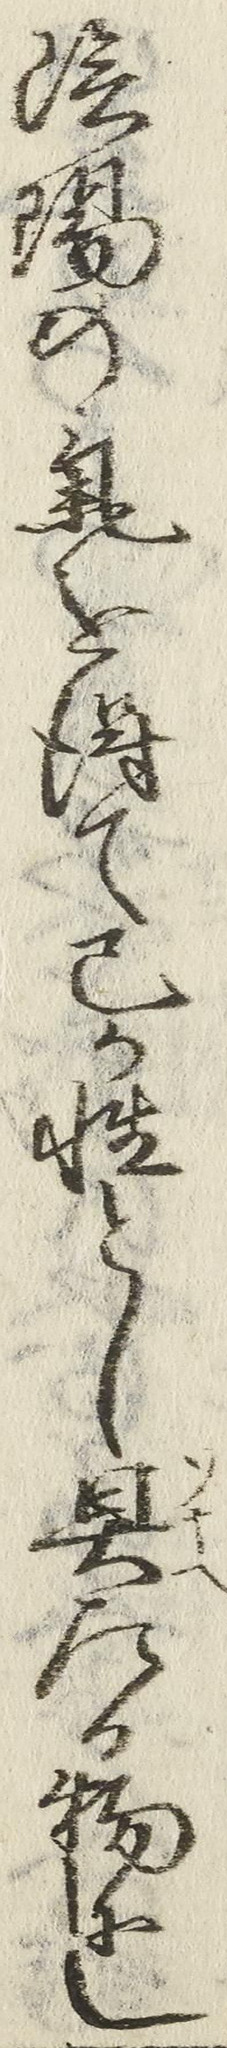陰陽の気を得て己か性とし具たる物にし
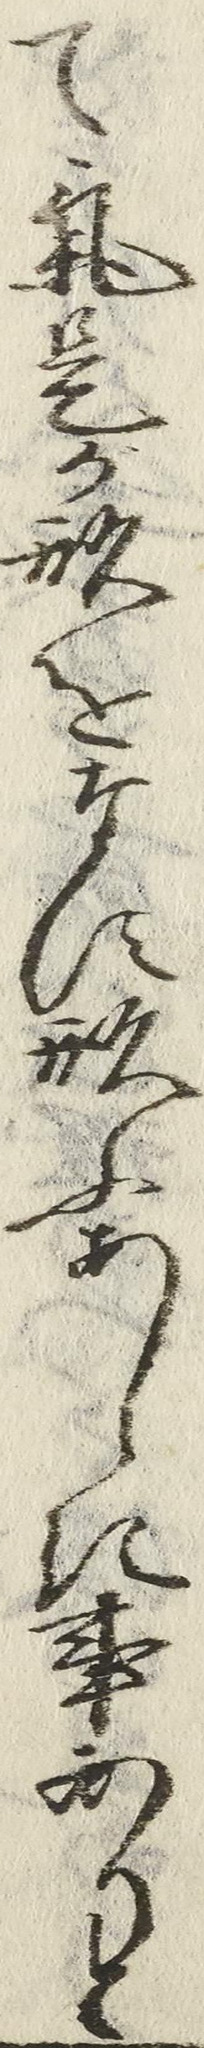て気是が形をなす形にあしき事ありと
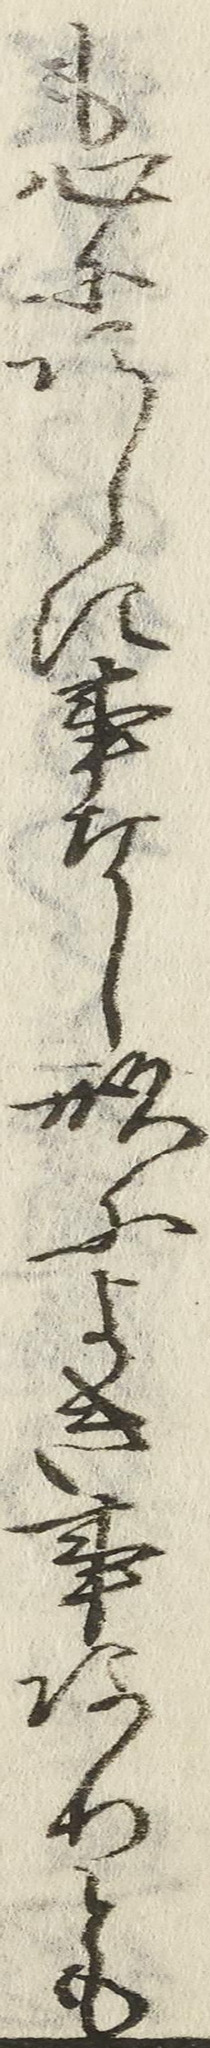も心にあしき事なし形によき事ありとも
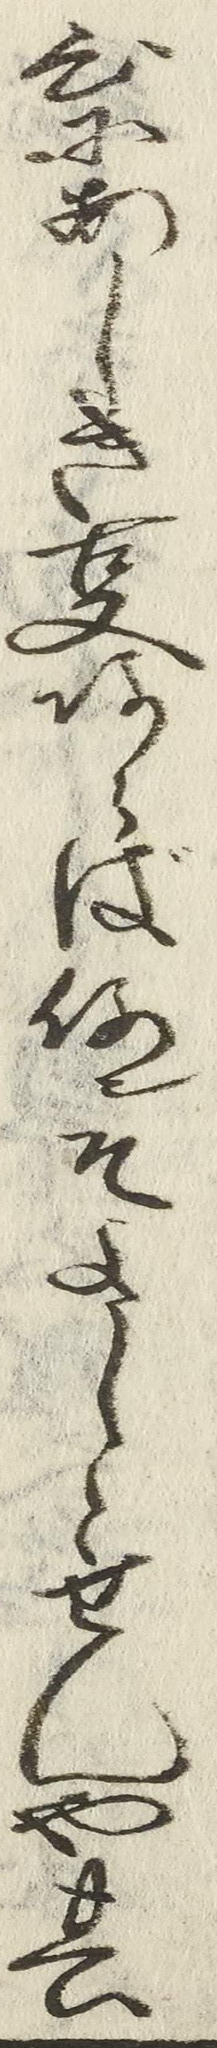心にあしき事あらば何ンそよしとせんや其
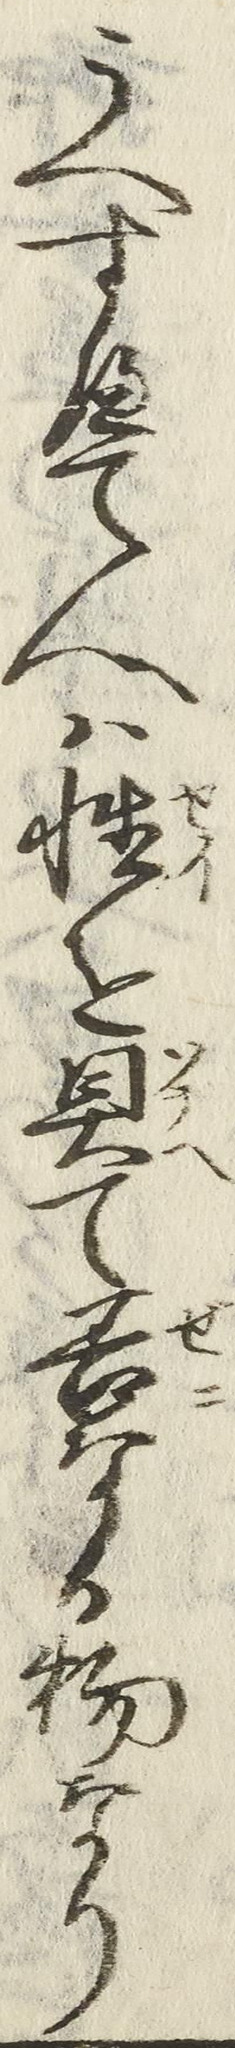うへすへて人は性を具て善なる物なり
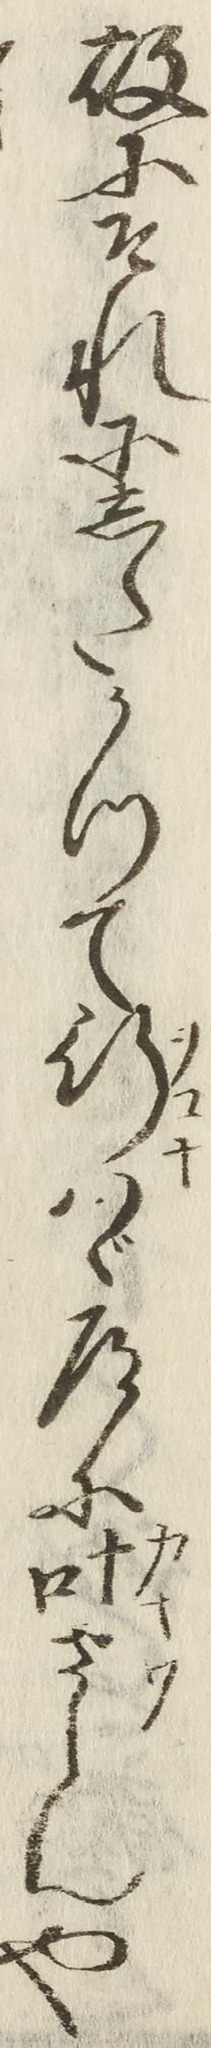故にそれにしたかつて行はゞ道に叶ざらんや
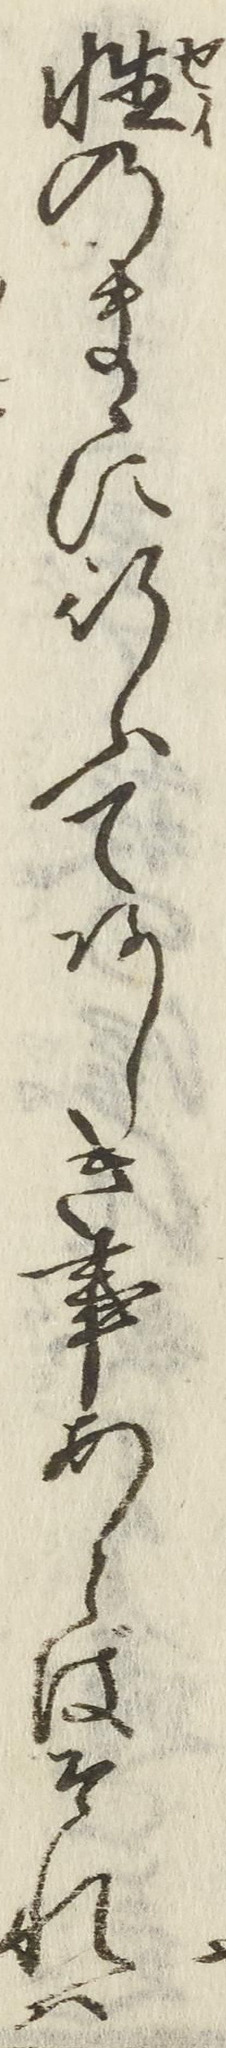性のまゝに行ふてあしき事あらばそれは
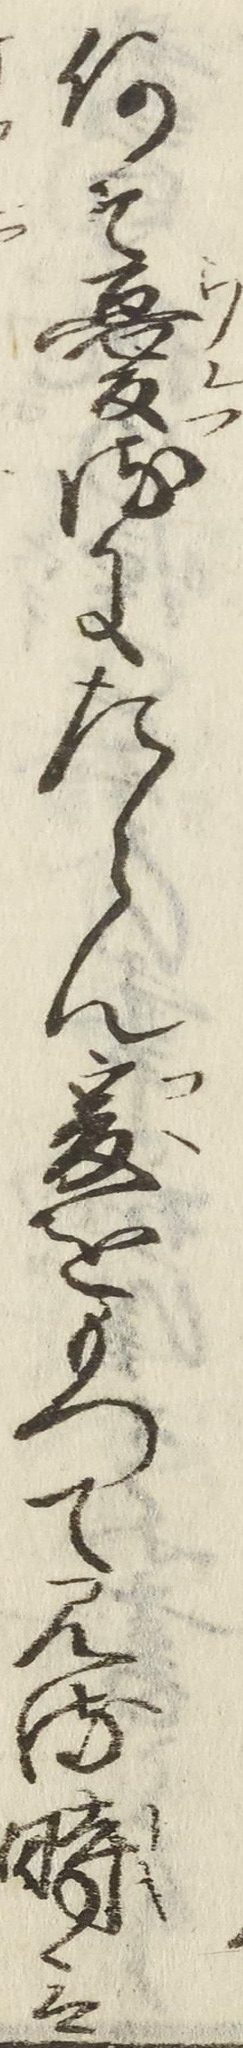何そ憂るにたらん爰をもつて見る時は
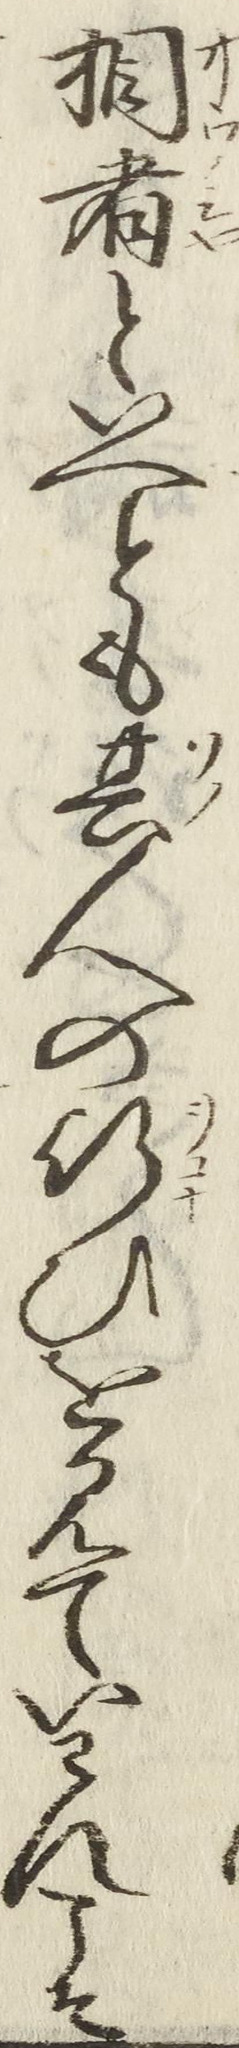相者といへとも其人の行ひを見ていわんこそ
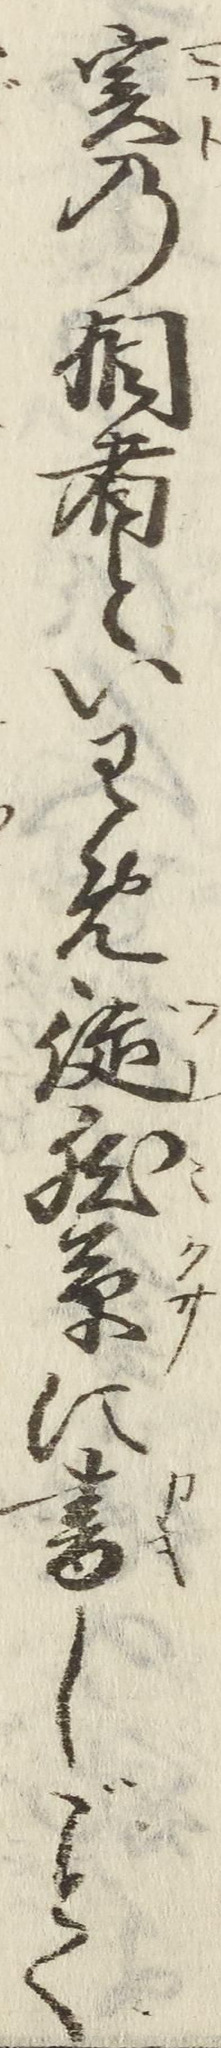実の相者といわめ徒然草に書しごとく
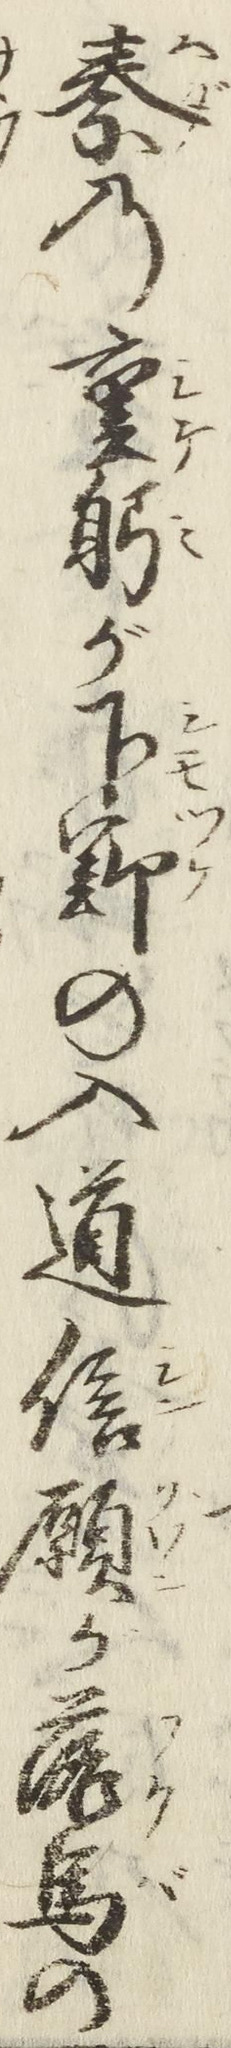秦の重躬が下野の入道信願が落馬の
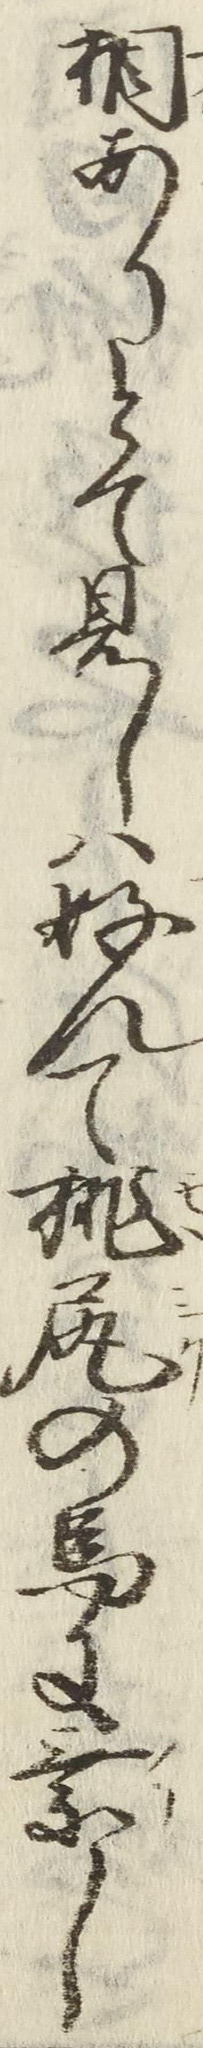相ありとて見しは好んて桃尻の馬に乗し
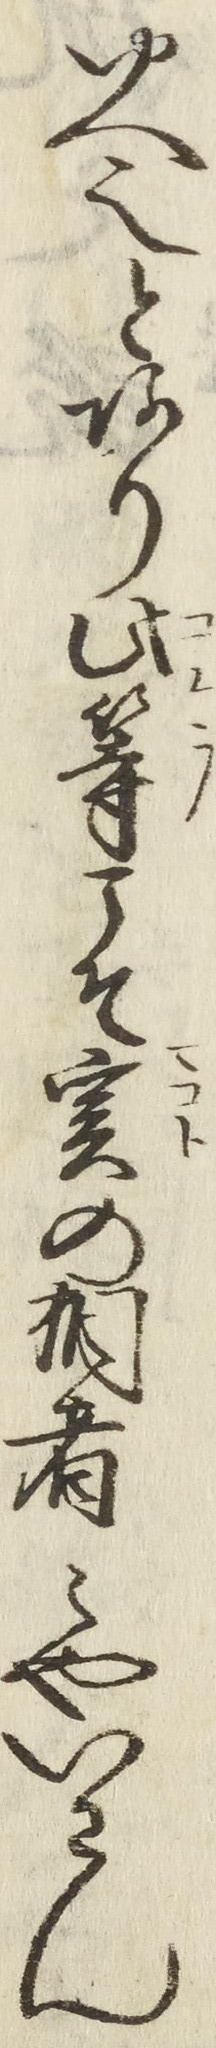ゆへ也とあり此等こそ実の相者とやいわん
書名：天地或問珍　地
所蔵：東京大学地震研究所図書室 Earthquake Research Institute Library, The University of Tokyo, JAPAN
